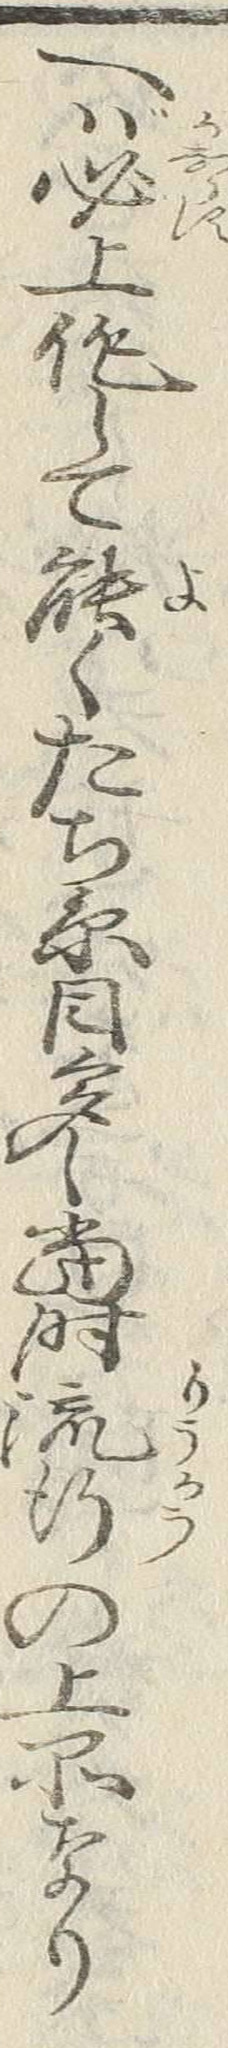へば必上作して能くたち糸目多し当村流行の上品なり
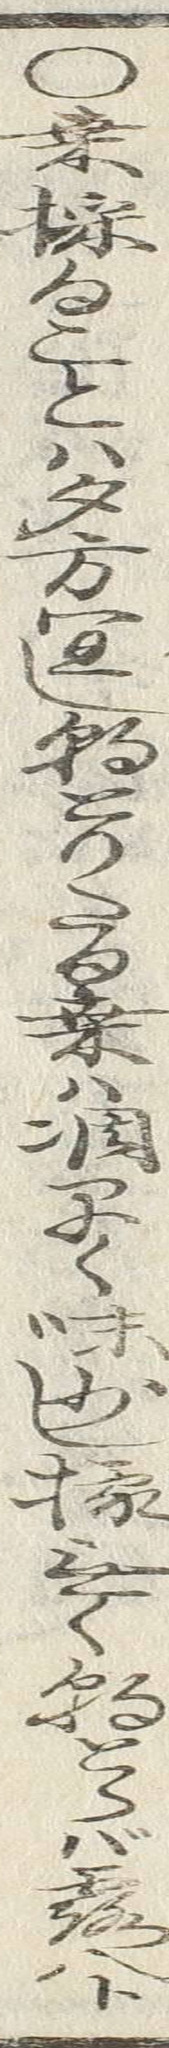○桑採ることは夕方宜し朝とりたる桑は凋早く味少し據無く朝とらば露八分
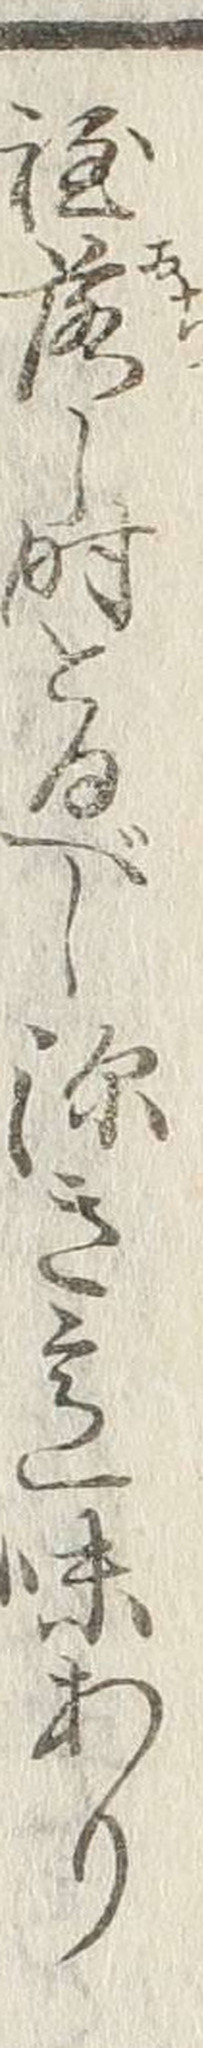程落し時とるべし深き意味あり
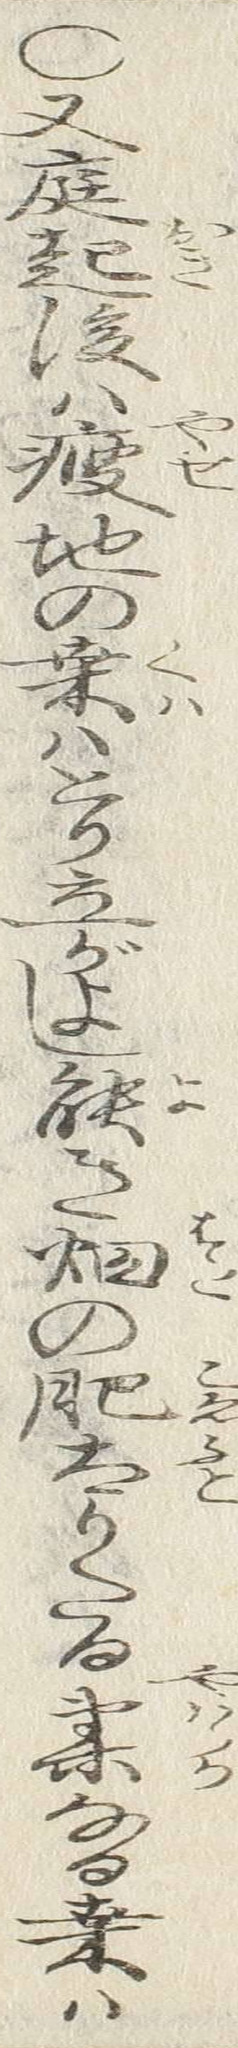○又庭起後は痩地の桑はとり立がよし能き畑の肥太りたる柔なる桑は
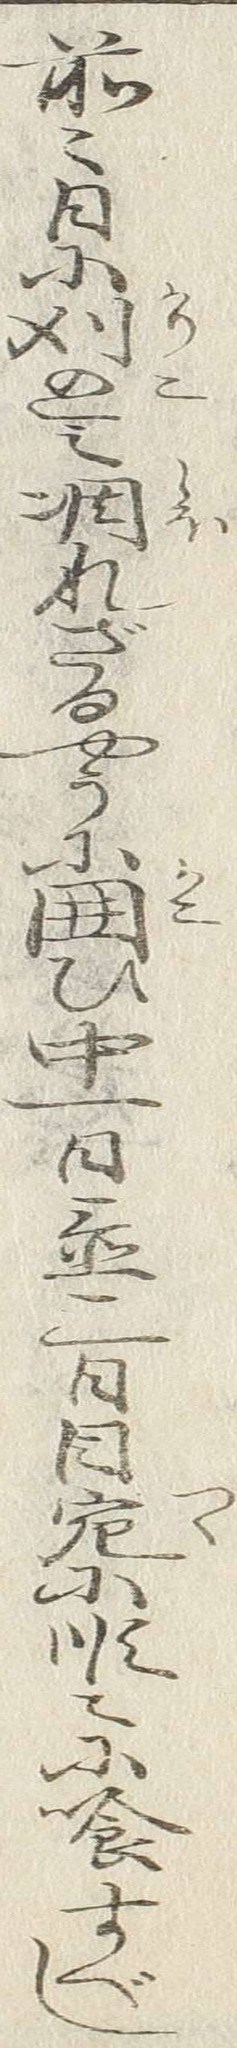前々日に刈込み凋れざるやうに囲ひ中一日置二日目宛に順々に喰すべし
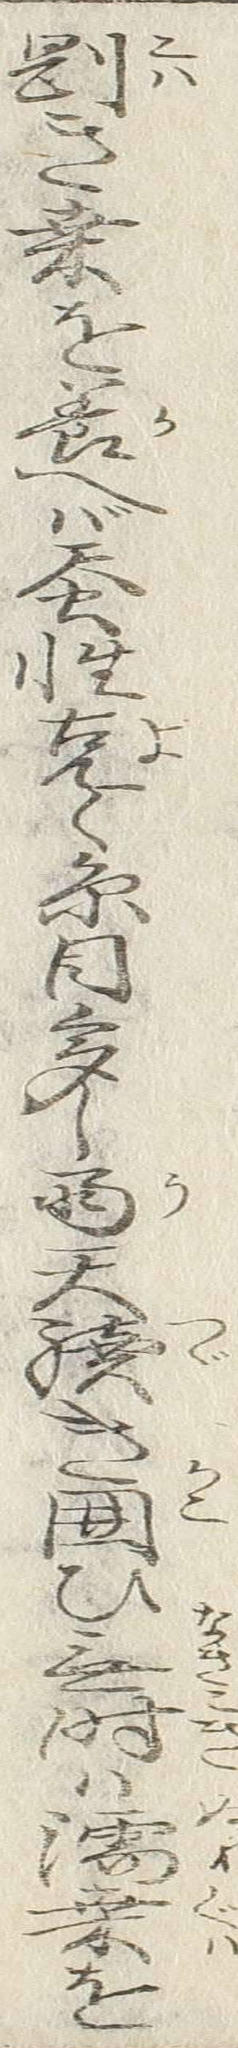剛き桑を養へば蚕性克く糸目多し雨天續き囲ひ無時は濡桑を
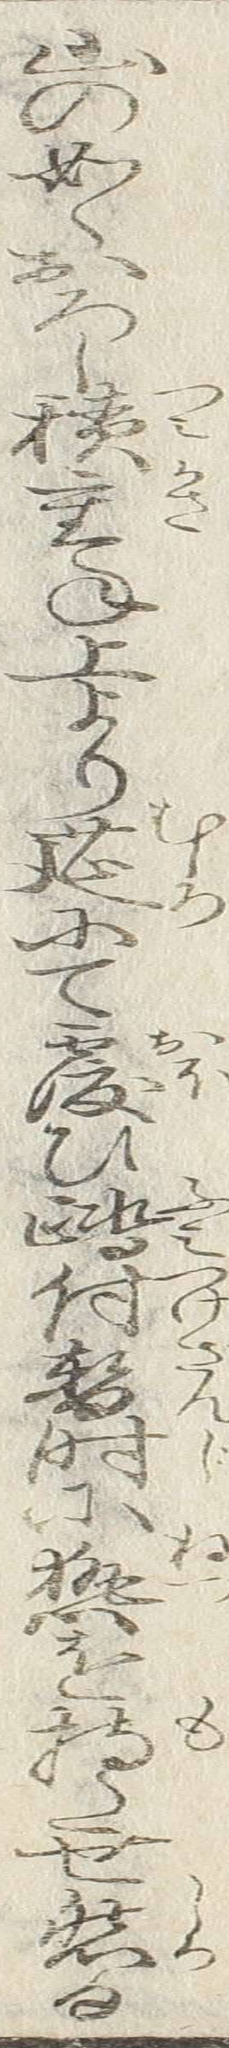山の如くおろし積重ね上より筵にて覆ひ踏付暫時に熱を持たせ然る
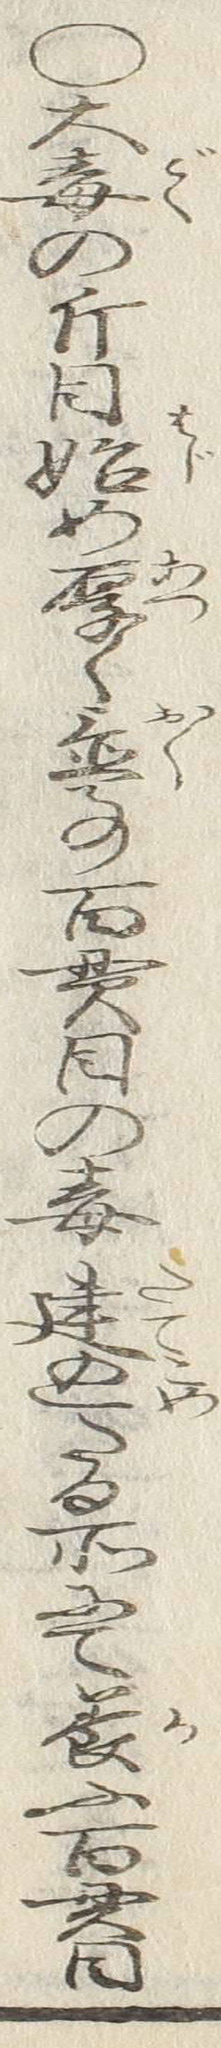○大毒の斤目始め厚く置事百貫目の毒建込たる所にて養ふ百貫目
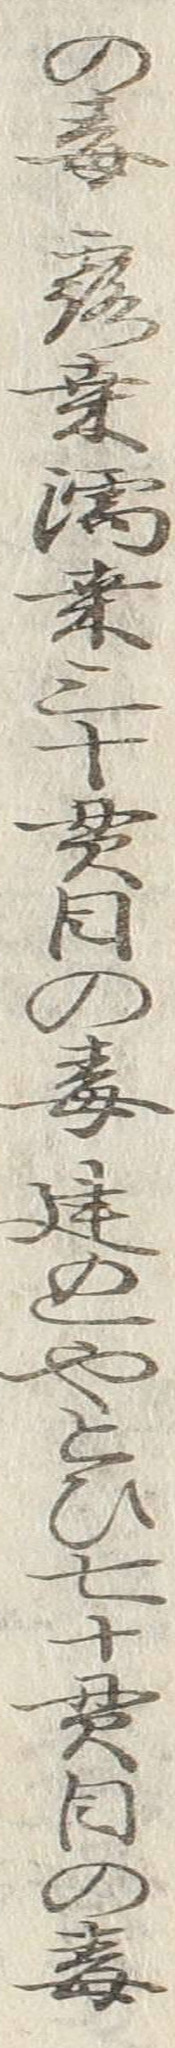の毒露桑濡桑三十貫目の毒建込やとひ七十貫目の毒
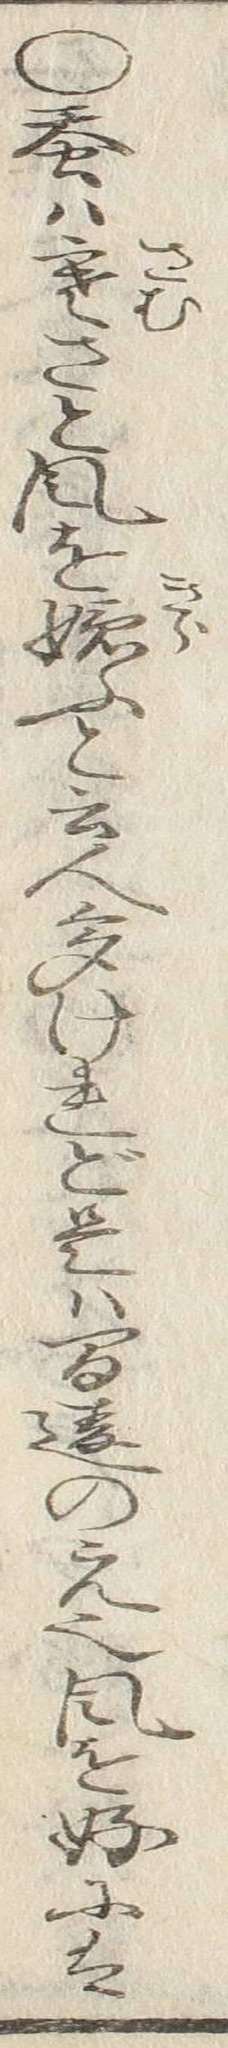○蚕は寒さと風を嫌ふと云人多けれど是は間違の元也風を好には

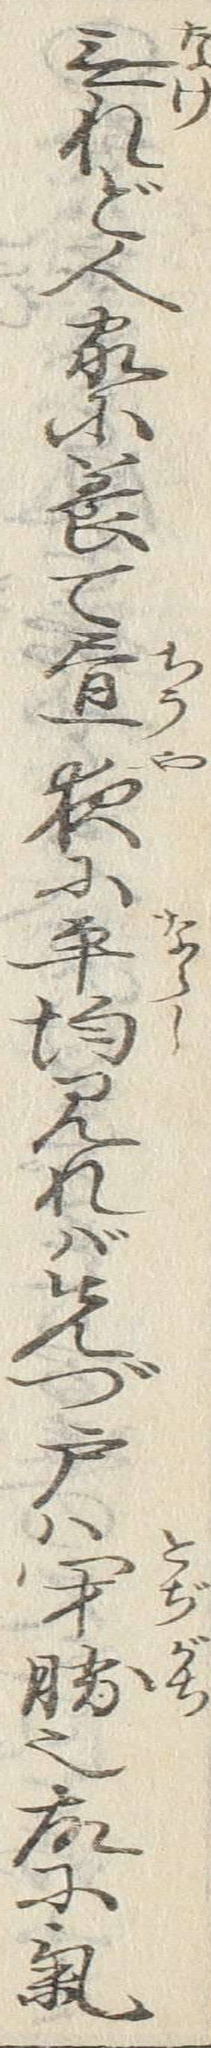無れど人家に養て昼夜に平均見れば先づ戸は閉勝也故に氣
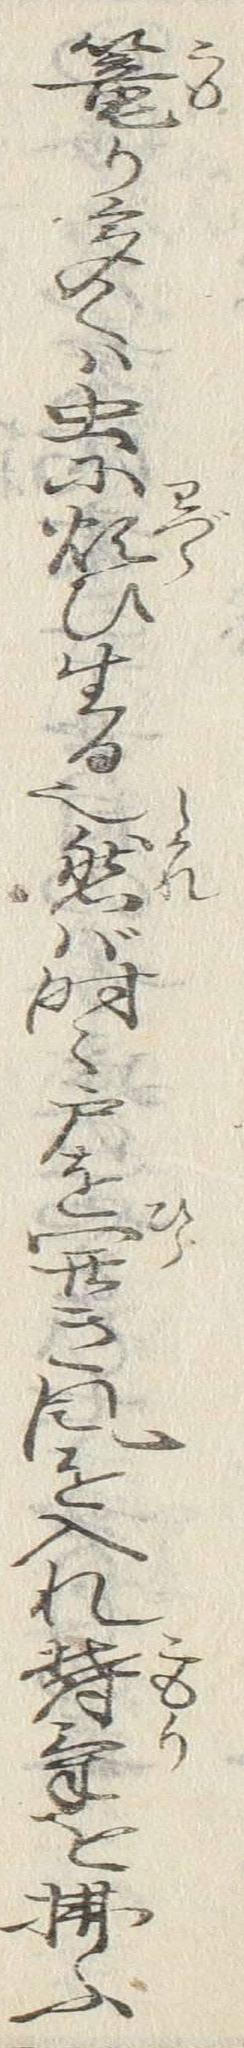篭り多くは虫に煩ひ生る也然ば時々戸を開き風を入れ鬱氣を拂ふ
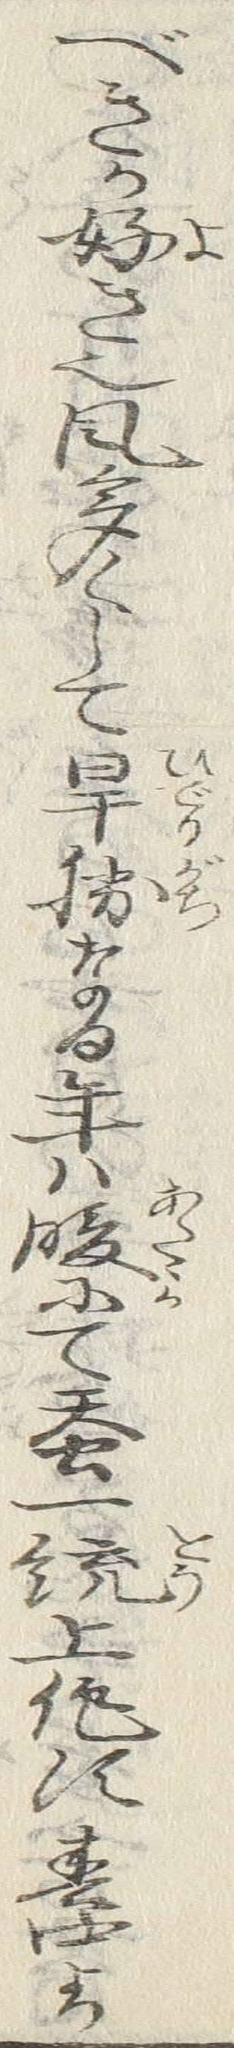べきか好き也風多くして旱勝なる年は暖にて蚕一統上作す春中より
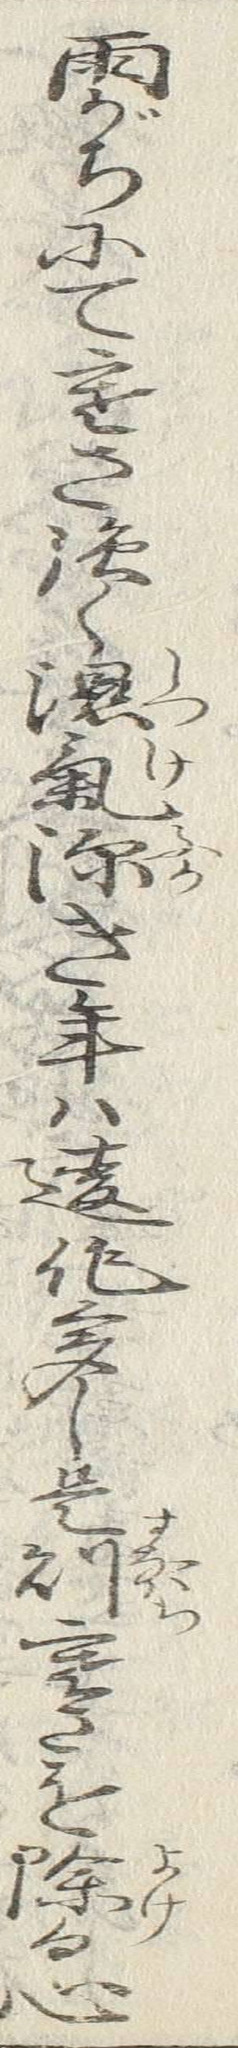雨がちにて寒さ強く湿氣深き年は違作多し是則寒さを除る心
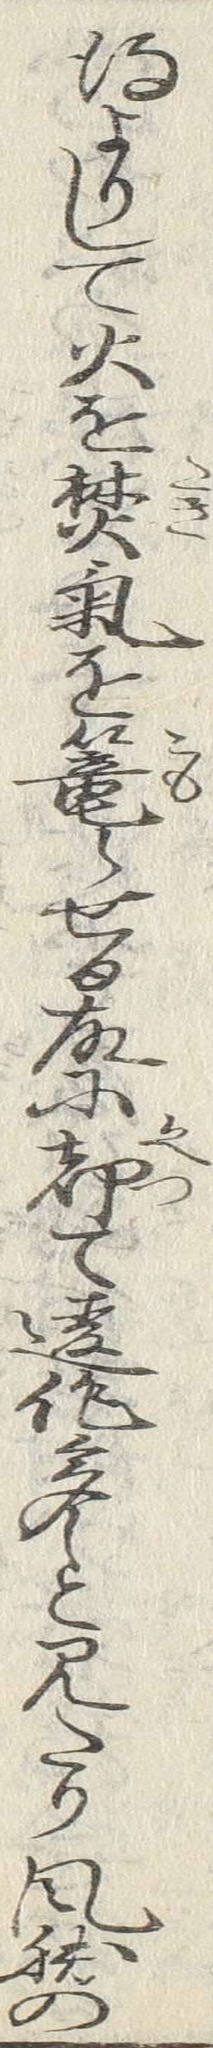得よりして火を焚氣を篭らせる故に却て違作多しと見たり風勝の
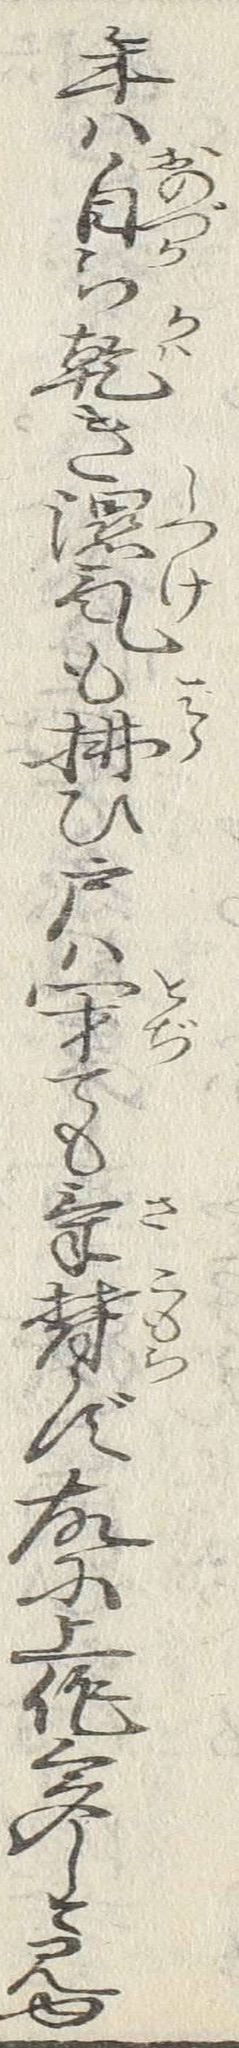年は自ら乾き湿氣も拂ひ戸は閉ても氣鬱ず故に上作多しと見ゆ
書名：養蠶實驗録
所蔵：東京大学農学生命科学図書館 国文学研究資料館
